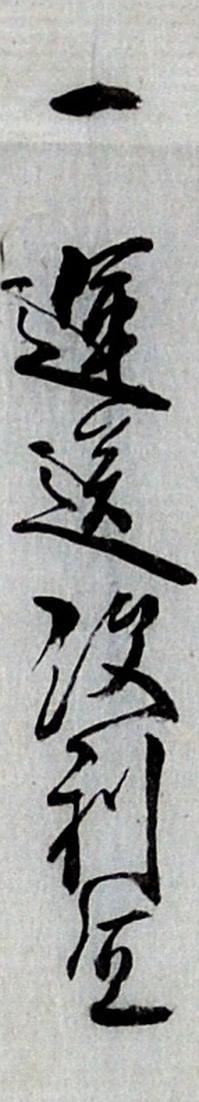一運送便利宜
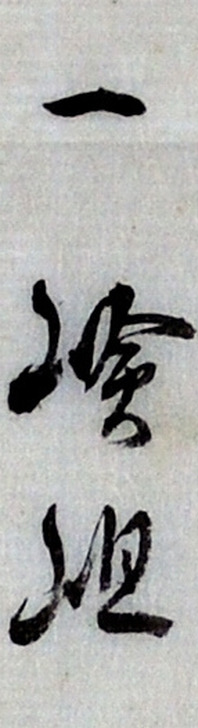一嶮岨
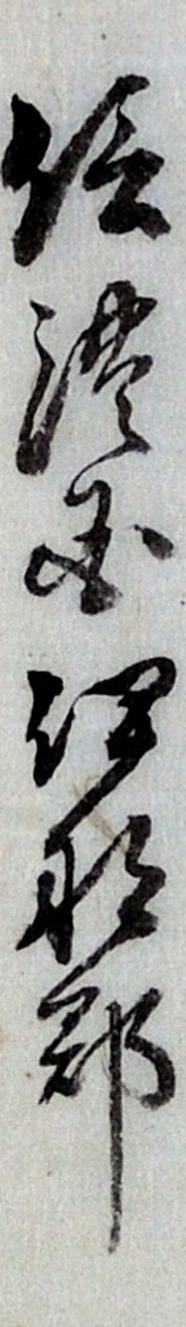信濃国伊那郡
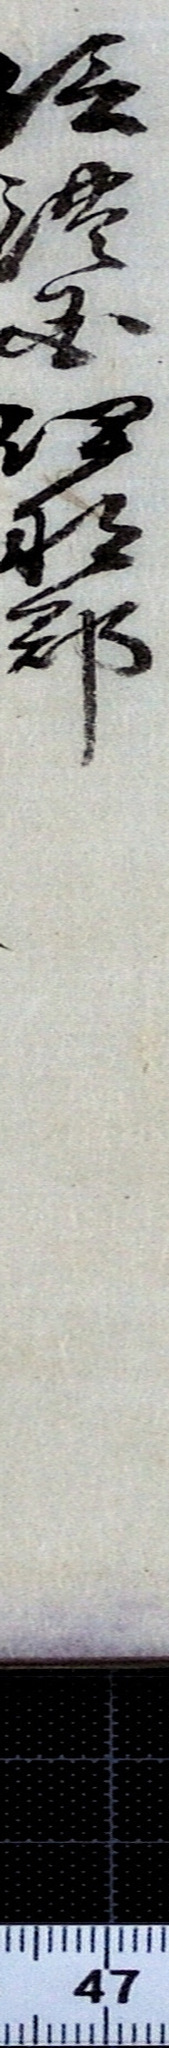信濃国伊那郡
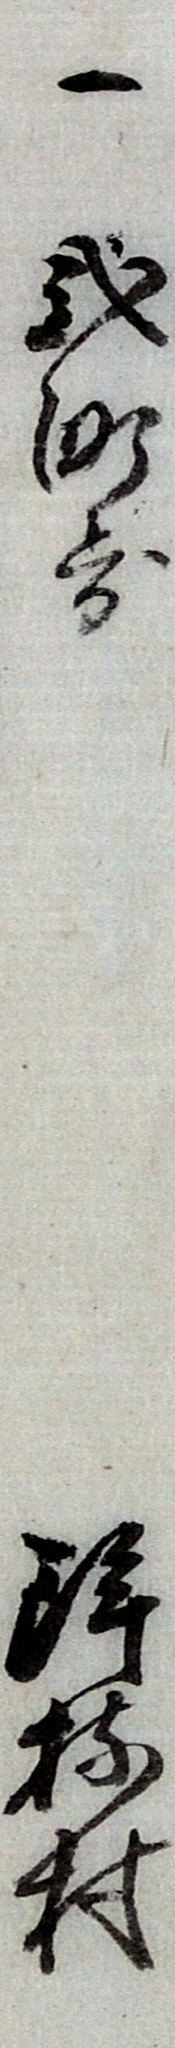一弐町歩鉾持村
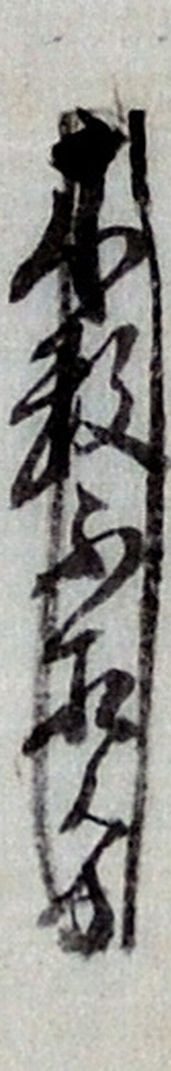木数不相分
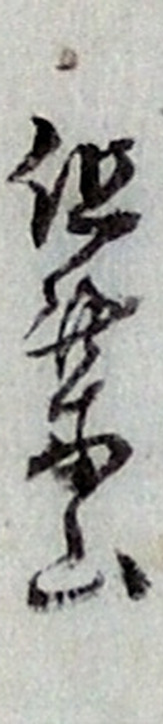但柴山
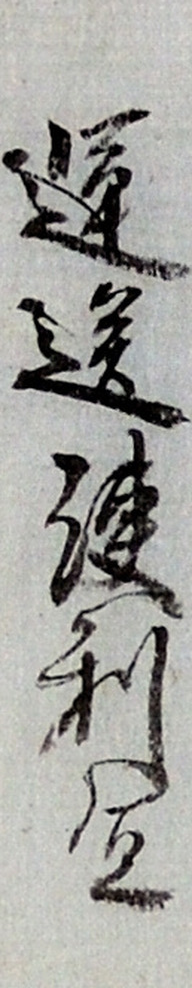一運送便利宜

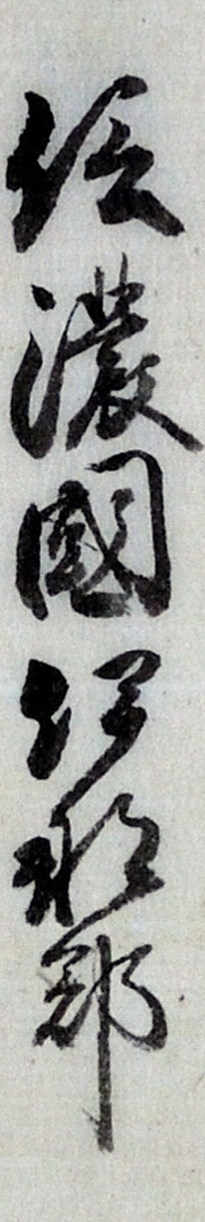信濃国伊那郡
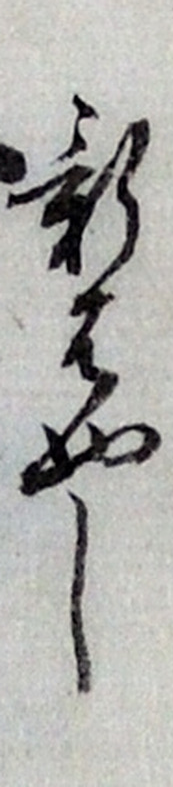新はやし
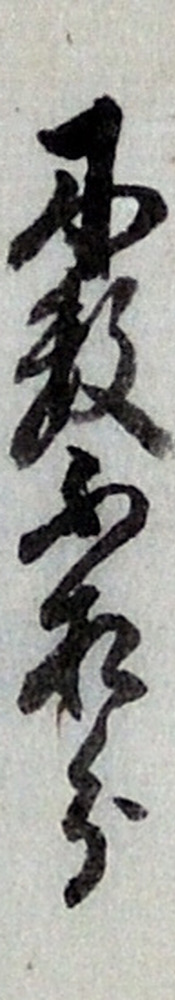木数不相分
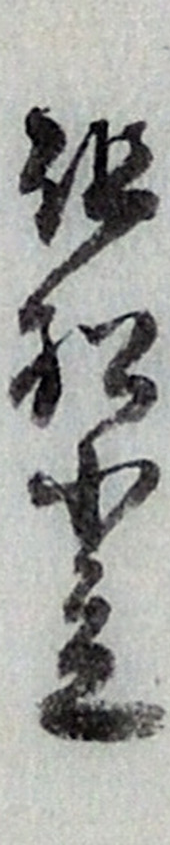但松小立
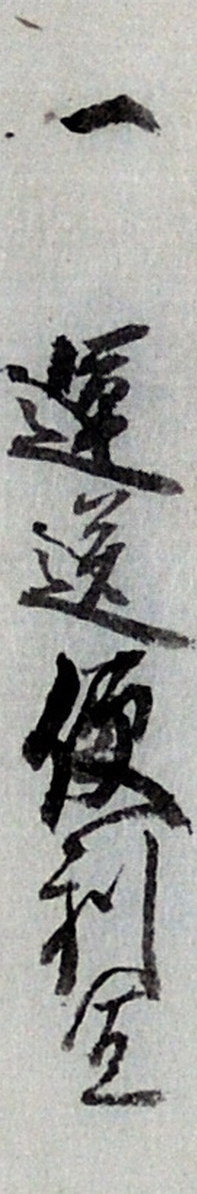一運送便利宜

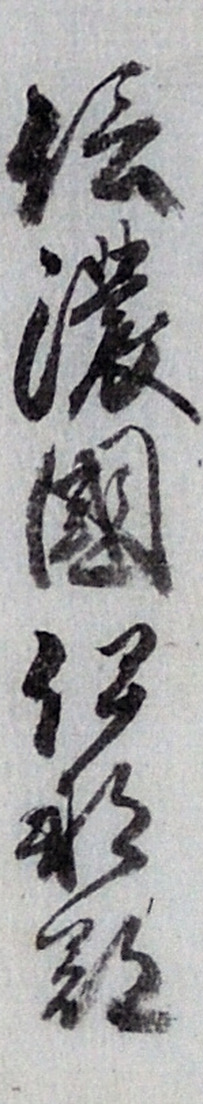信濃国伊那郡
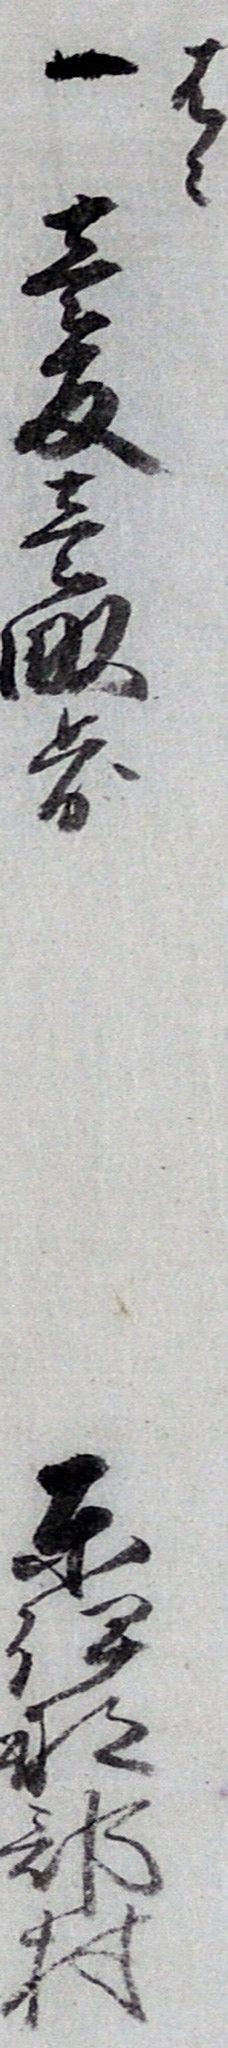一壱反壱㽗歩東伊那部村
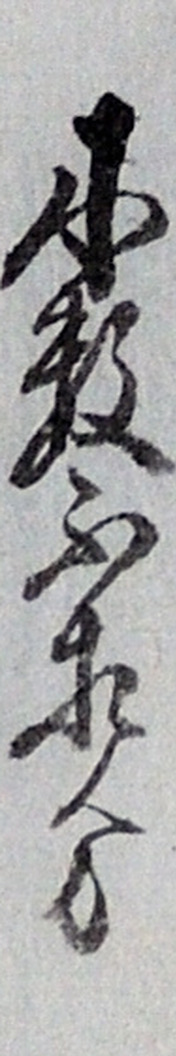木数不相分
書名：官林反別帳
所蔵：伊那市立高遠町図書館・合同会社AMANE
